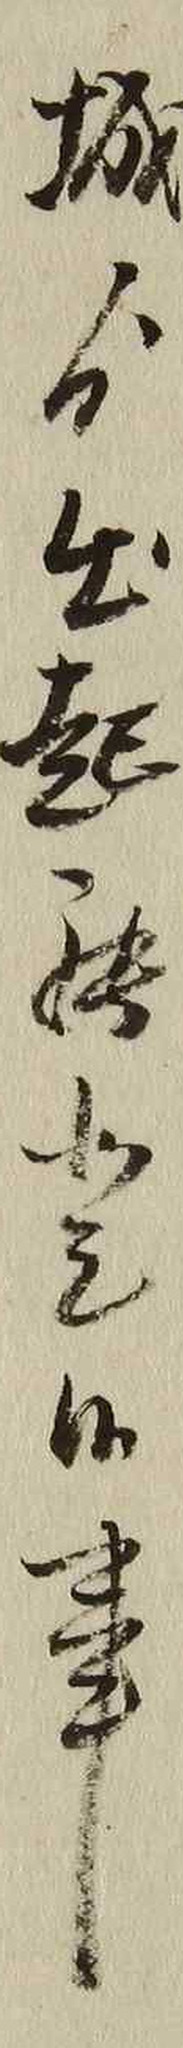城ゟ出起罷登候事
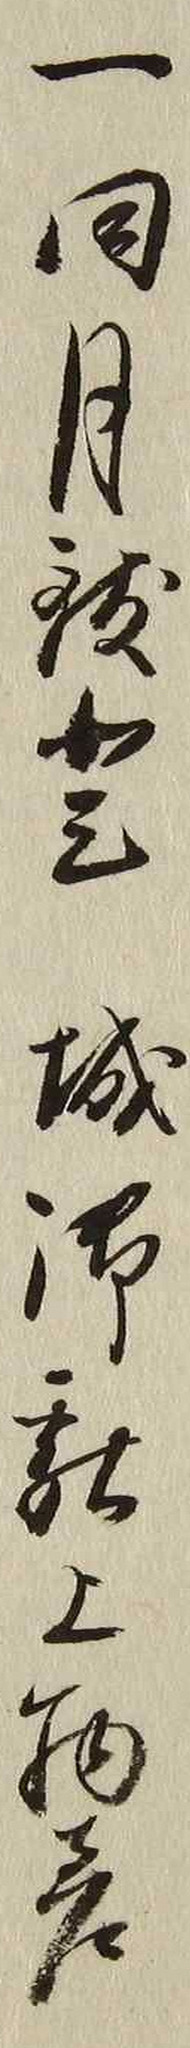一同月致登城御献上物産
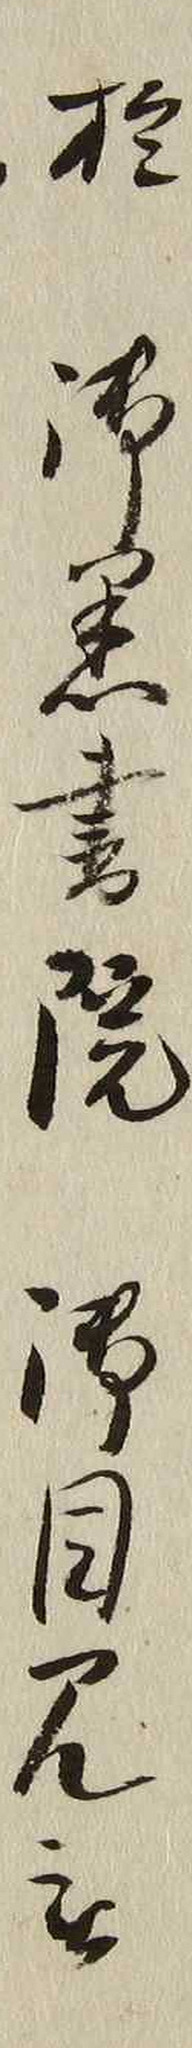於御黒書院御目見被
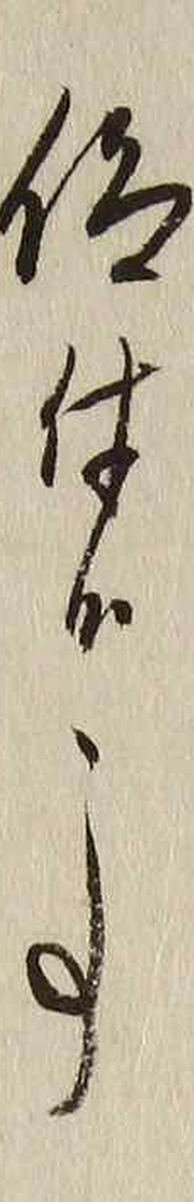仰付候事
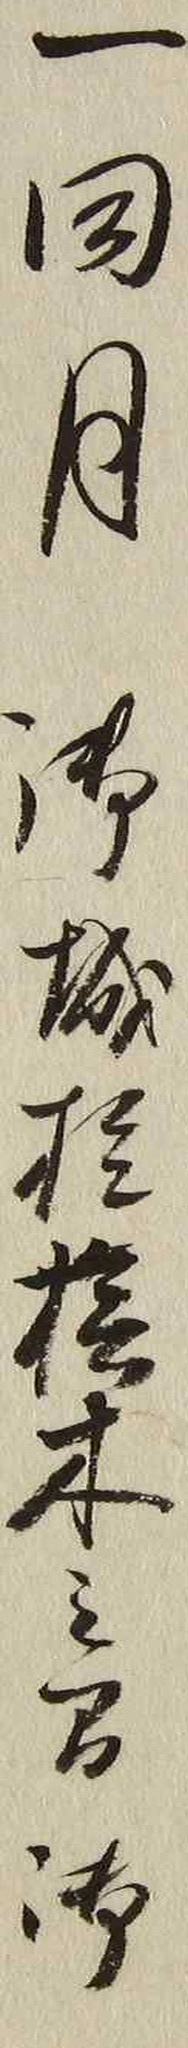一同月御城於檜木之間御
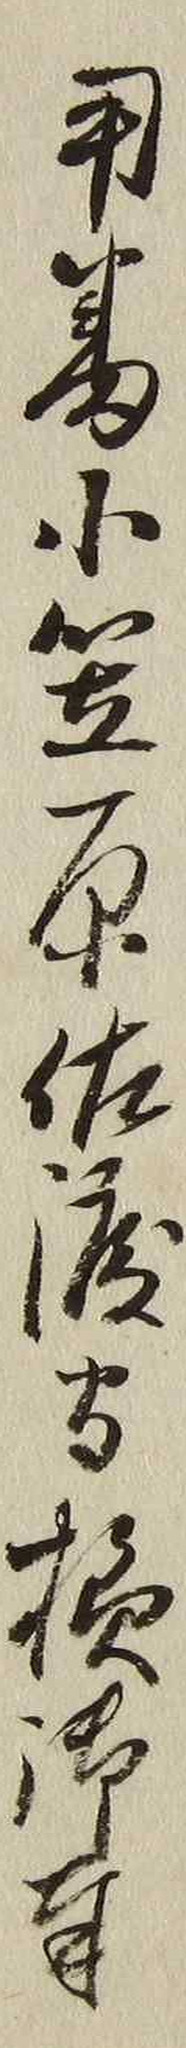用番小笠原佐渡守様御奉
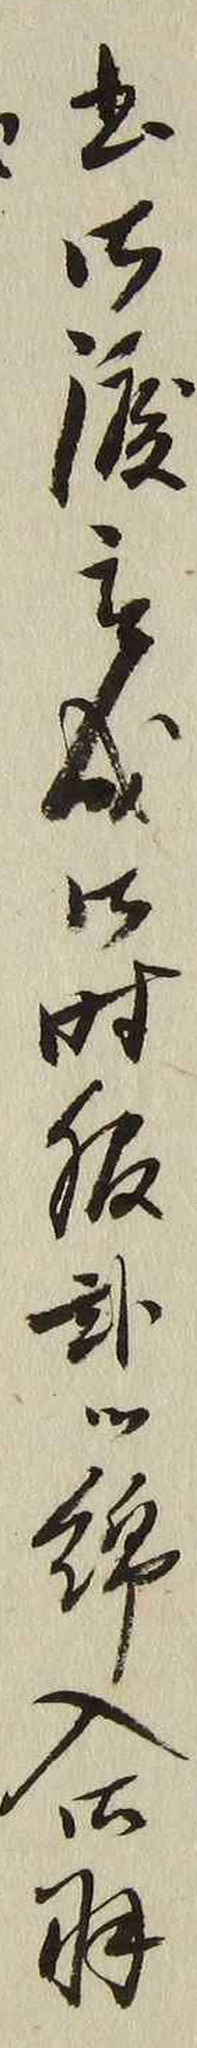書御渡被成候時服弐ツ綿入御羽
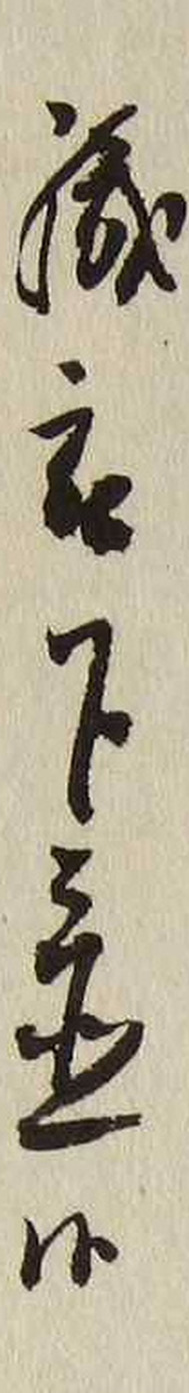織被下置候
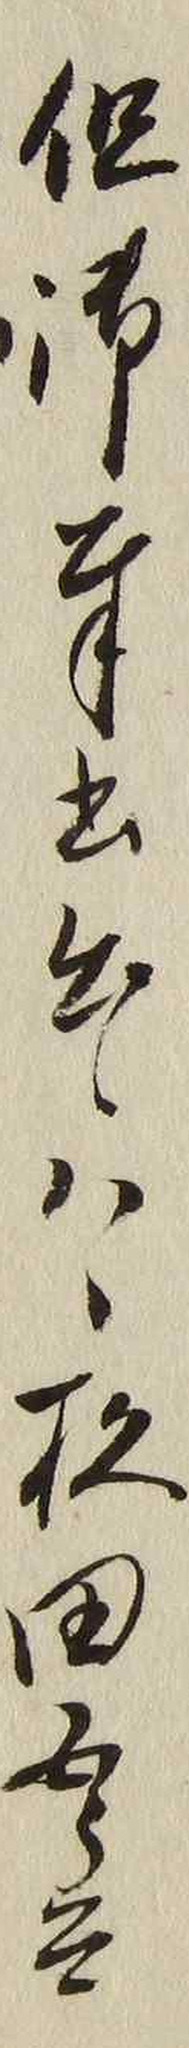但御奉書出候ハヽ杉田五郎兵
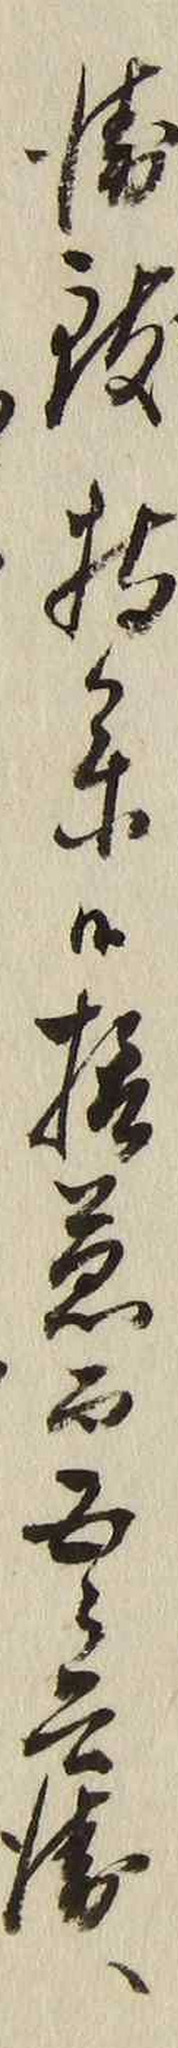衛致持参候様兼而五郎兵衛へ
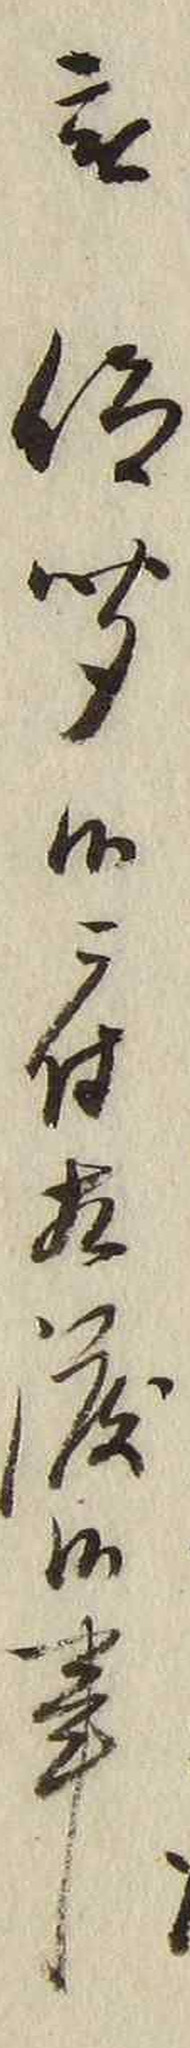被仰聞候ニ付相渡候事

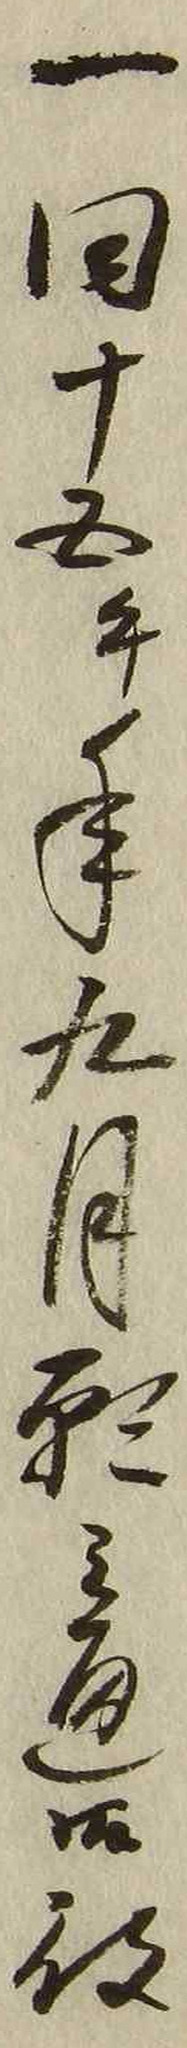一同十五午年九月願之通御役
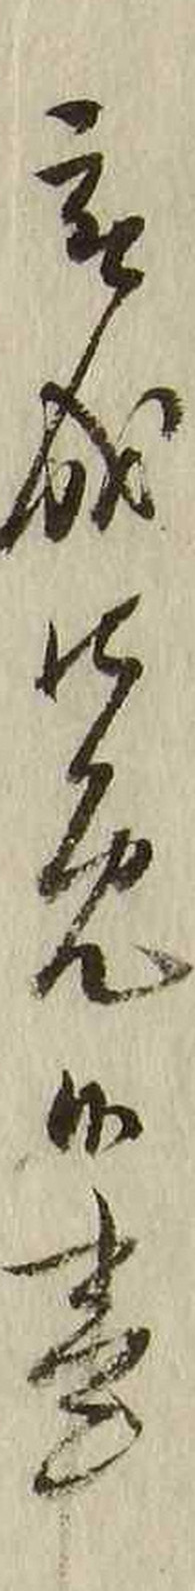被成御免候事
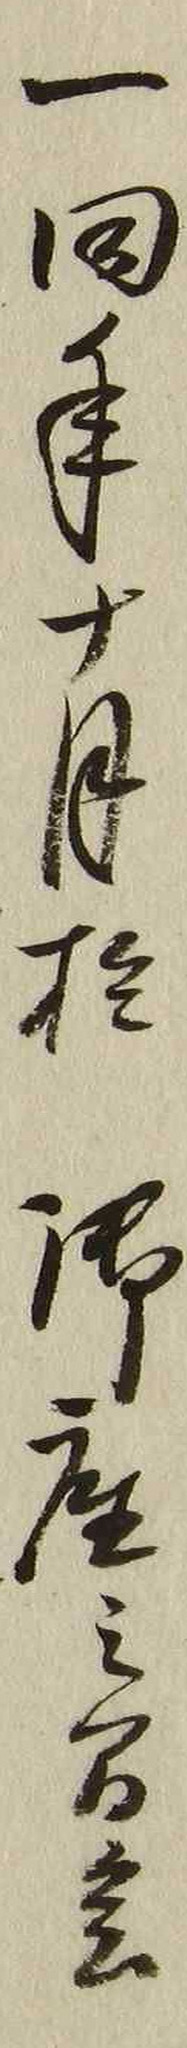一同年十月於御座之間会
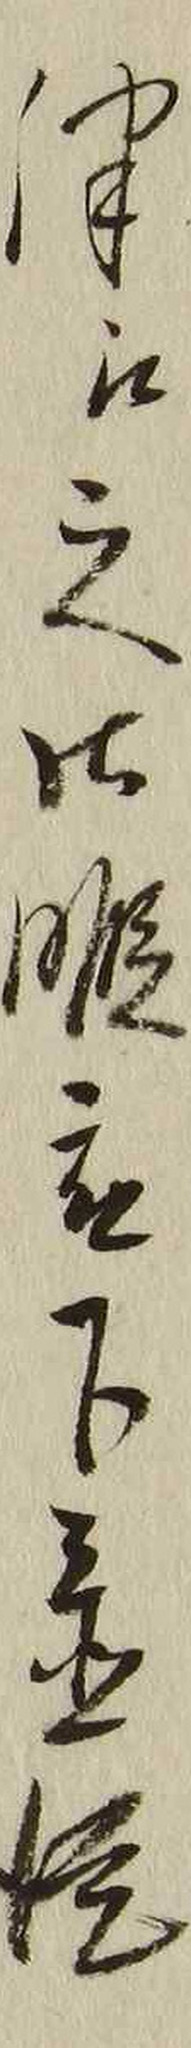津江之御暇被下置従
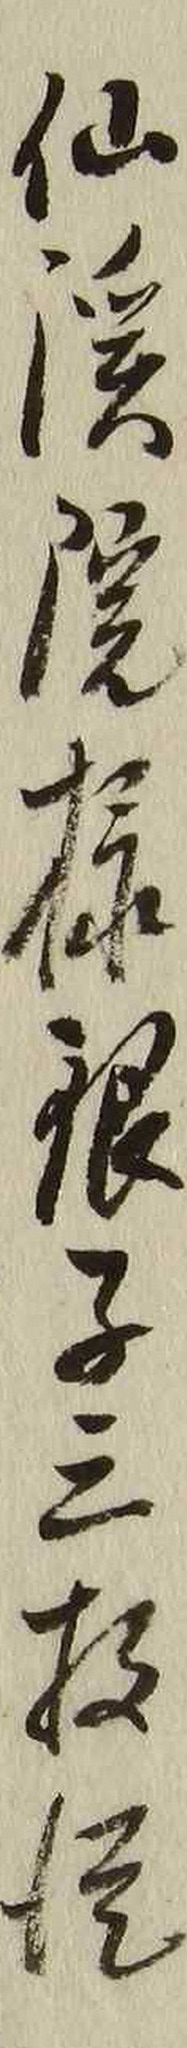仙渓院様銀子三枚従
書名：諸士系譜　巻之355　す之部5
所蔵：会津若松市立会津図書館
